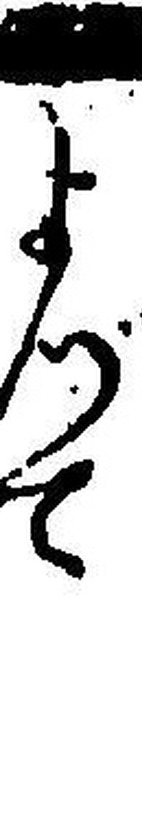よつて
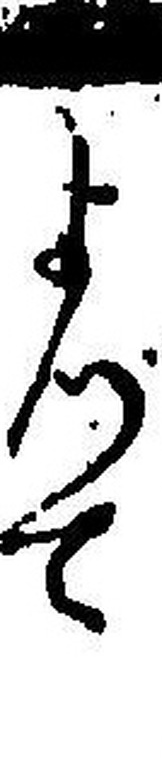よつて
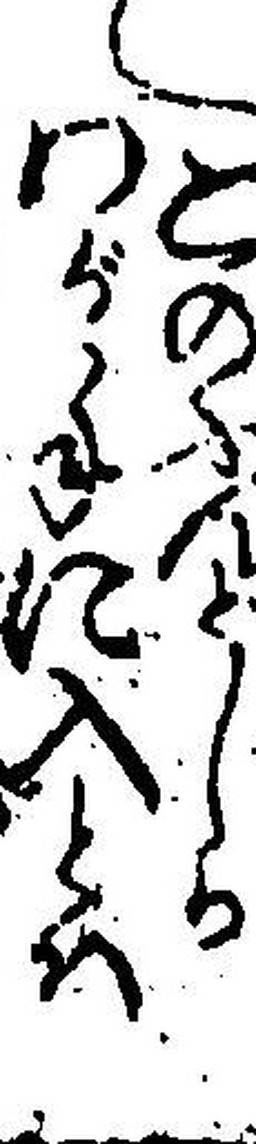わが手に入とは
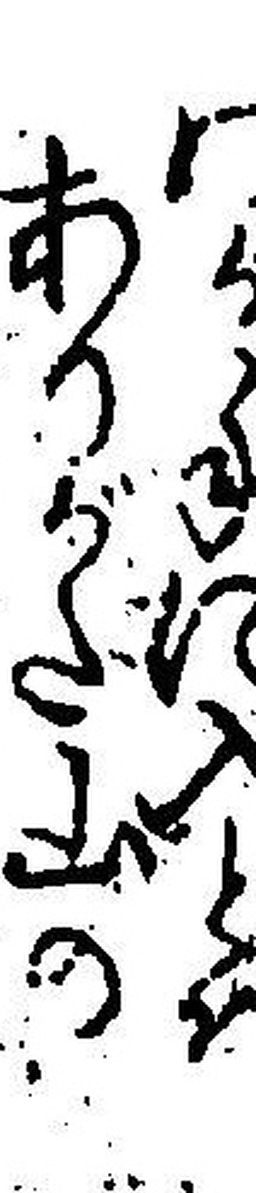ありがた山の
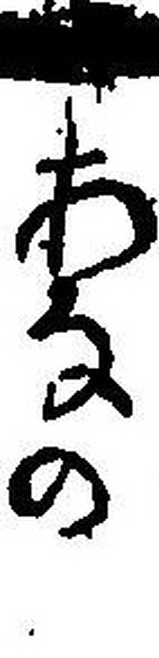あなの
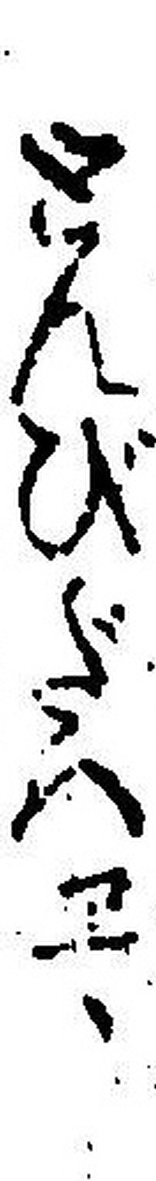とんびだはヱヽ
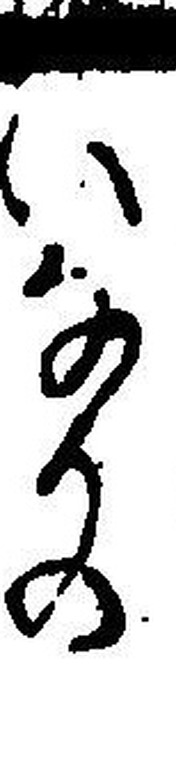いなりの
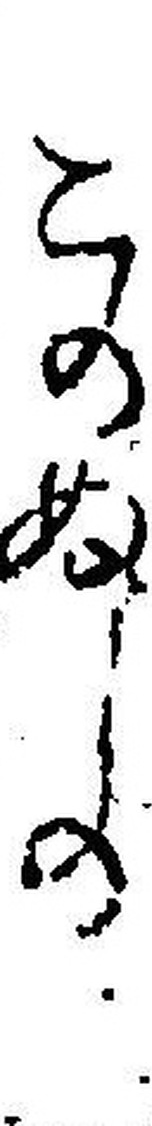このぬいの
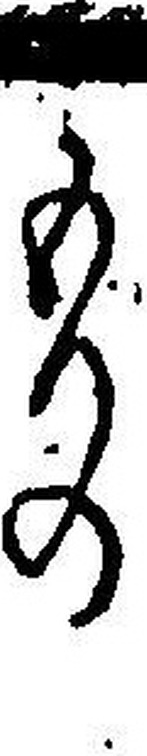もりの
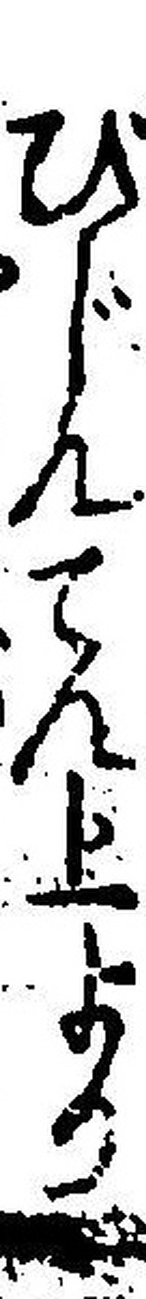びじんてん上より
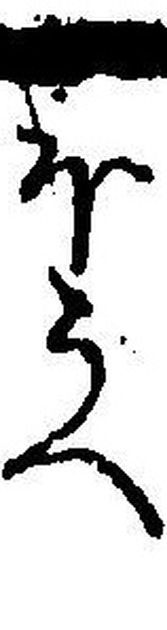ほうへ
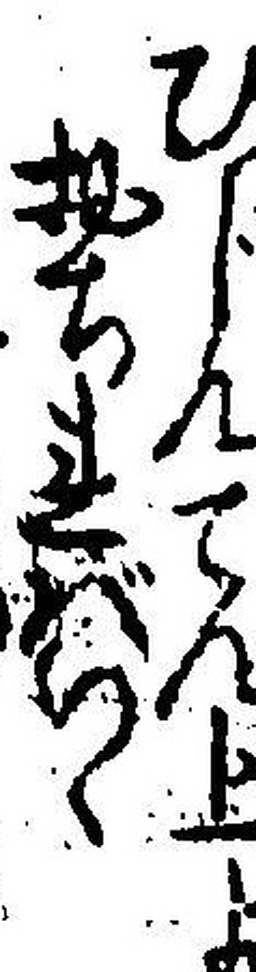おちればいゝ
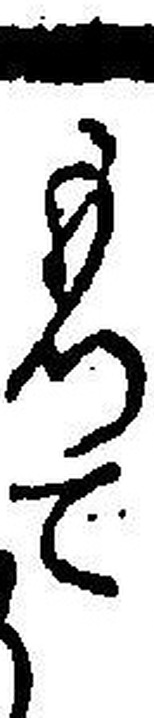もつて
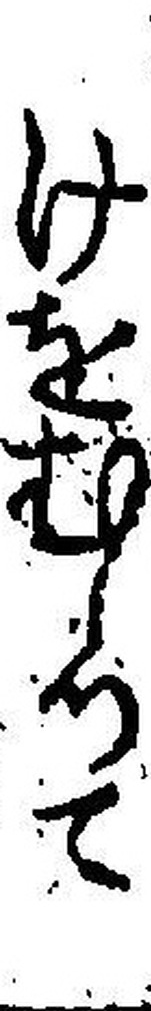けをむしつて
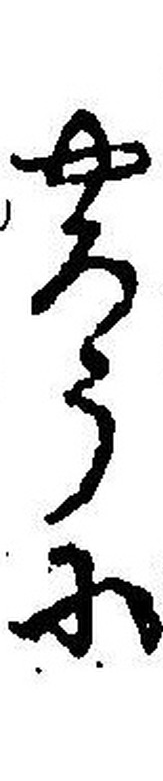やろうに

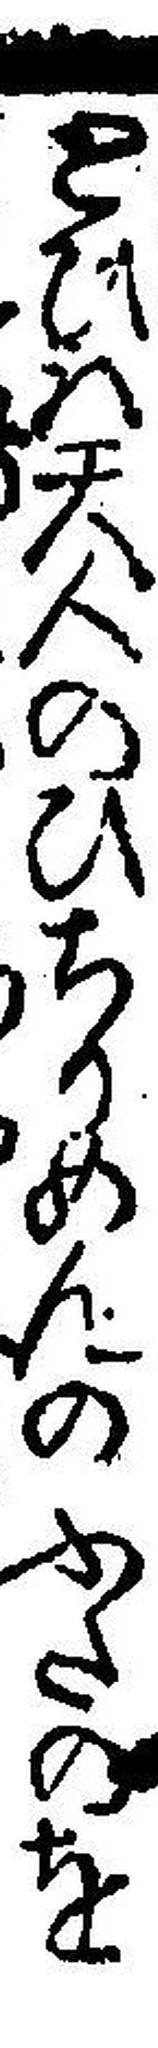とびは天人のひちりめんのふたのを
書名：徳若水縁起金性 / 樹下石上作
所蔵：東京大学総合図書館 General Library in the University of Tokyo, JAPAN
